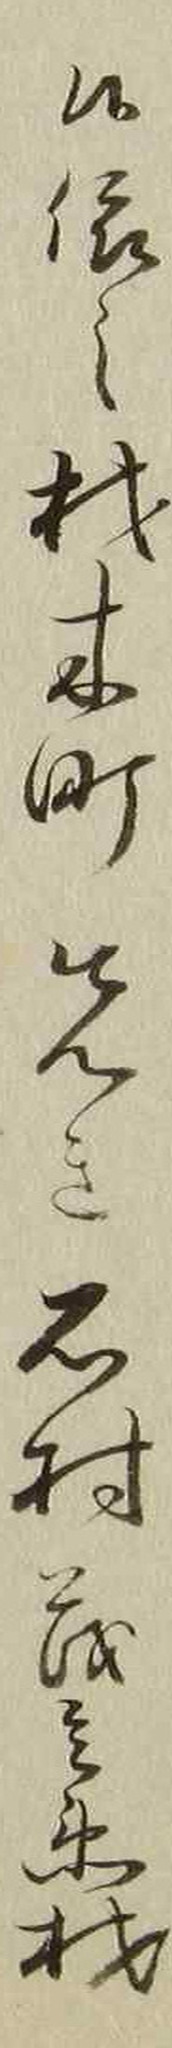候依之材木町先き石村茂兵衛材
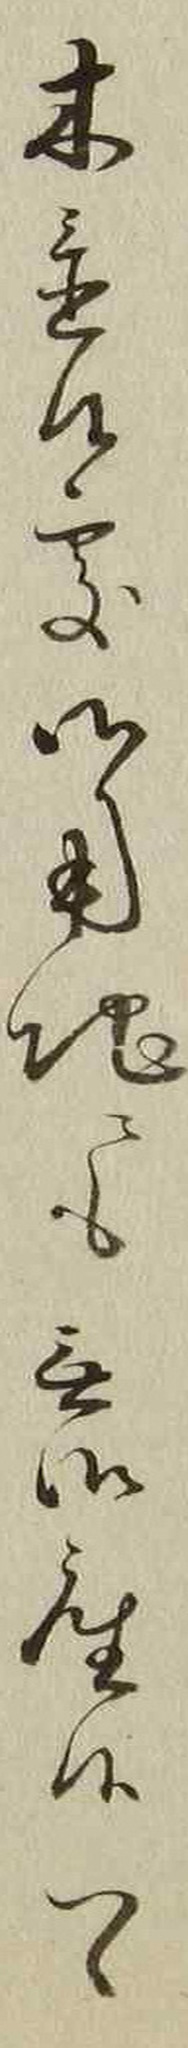木置候処御用地ニも無御座候ハバ
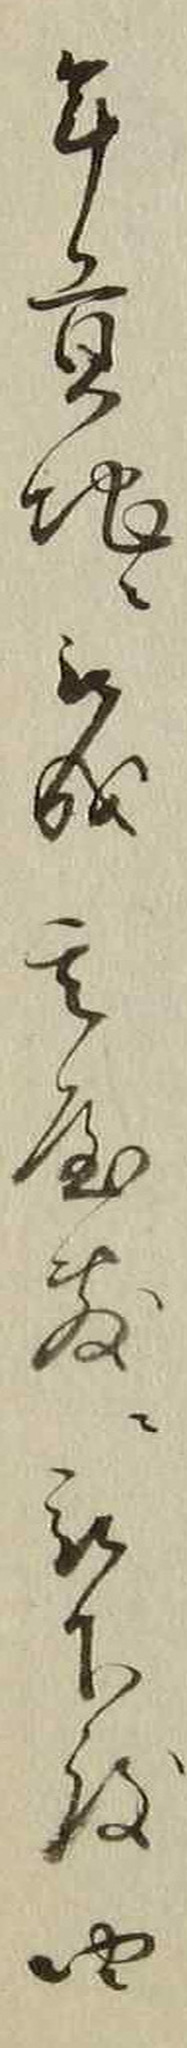年貢地ニ被成其屋敷ニ被下度由
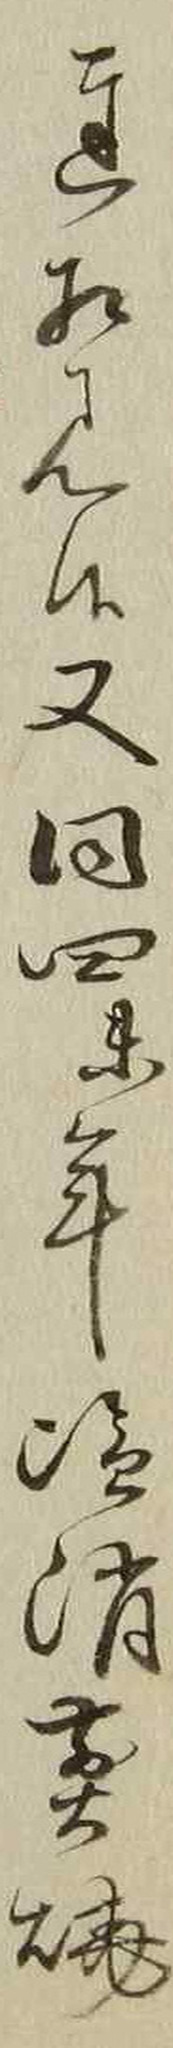達相見候又同四未年塩消煎焼
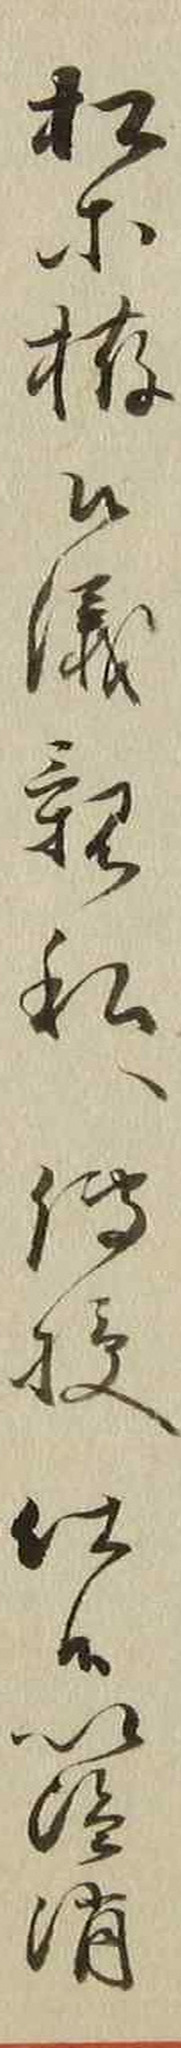松等拵候儀親私へ伝授仕候以塩消
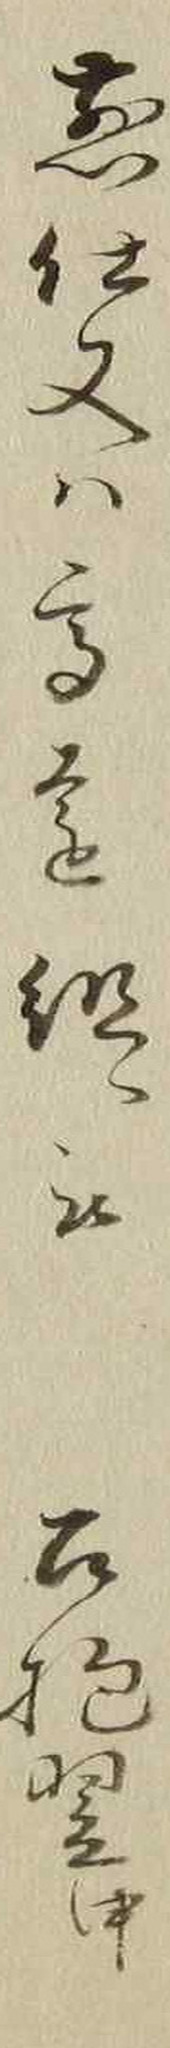煎仕又ハ高遠組へ被召抱翌申
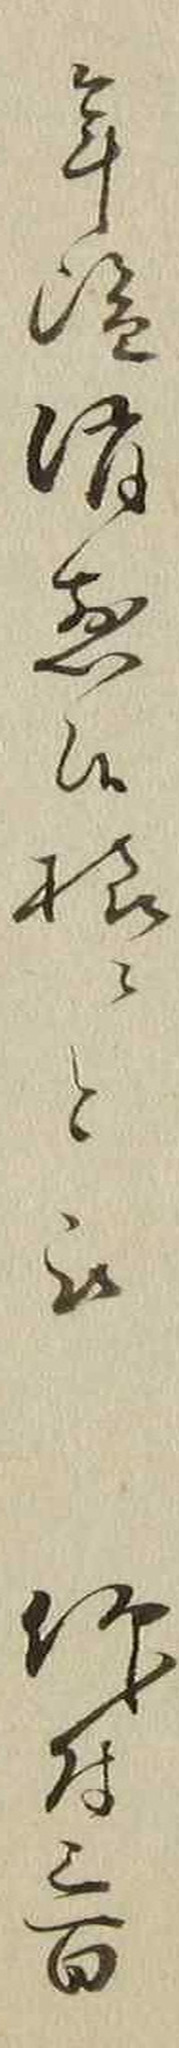年塩消煎候様ニと被仰付三百
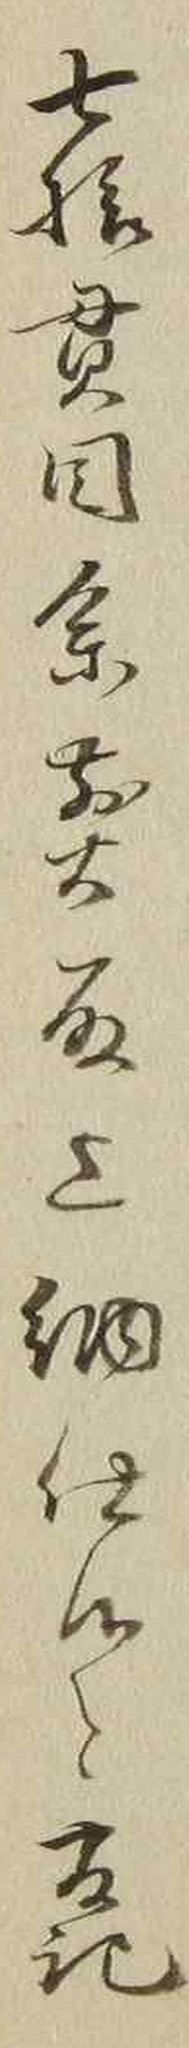七拾貫目余前火取上納仕候と書記
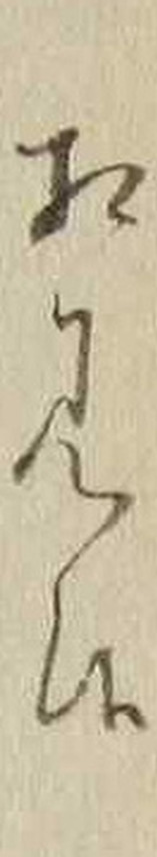相見候
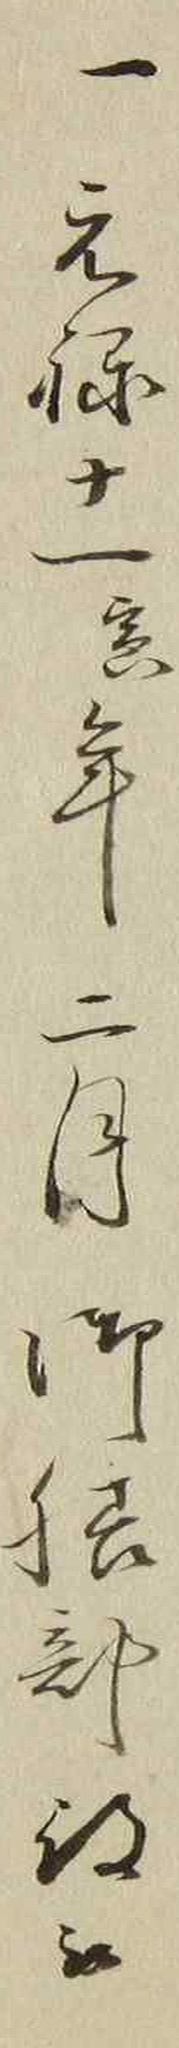一元禄十一寅年二月御膳部役被
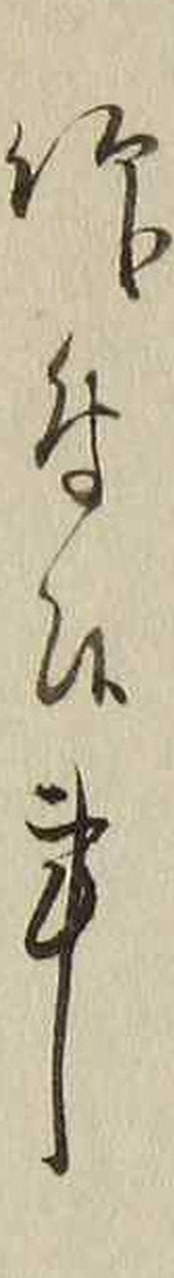仰付候事
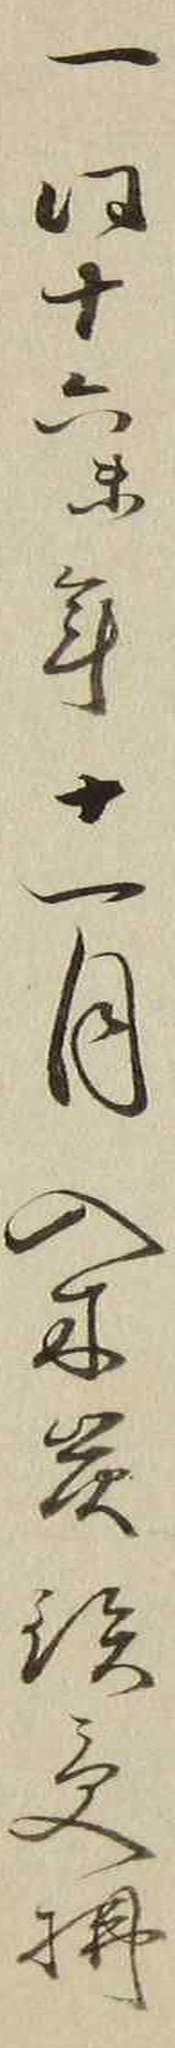一同十六未年十一月入木炭鉄受払
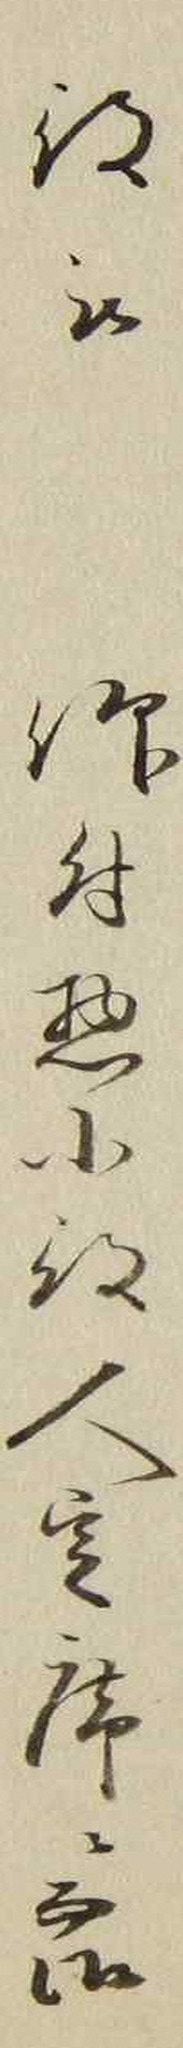役被仰付惣小役人定席ニ而御
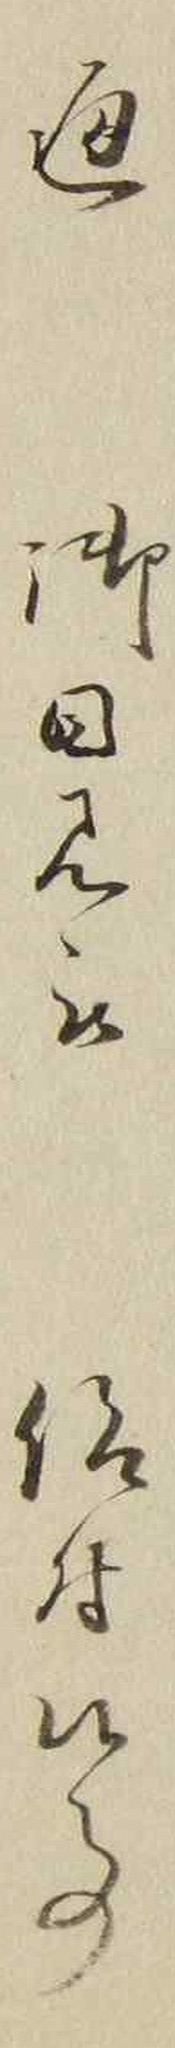通御目見被仰付候事
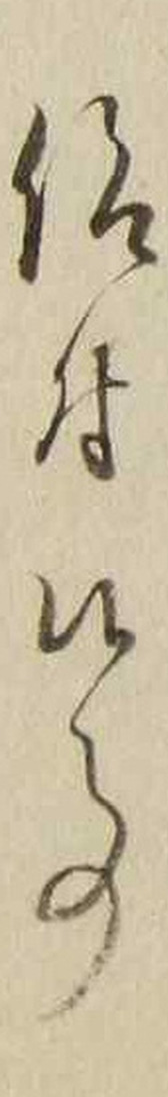仰付候事

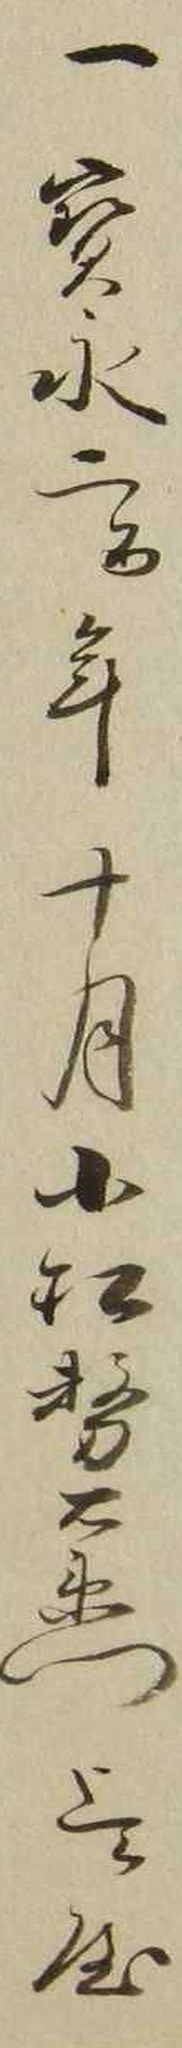一宝永二酉年十月小松務右衛門上屋
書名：諸士系譜　巻之52　に之部3
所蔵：会津若松市立会津図書館
